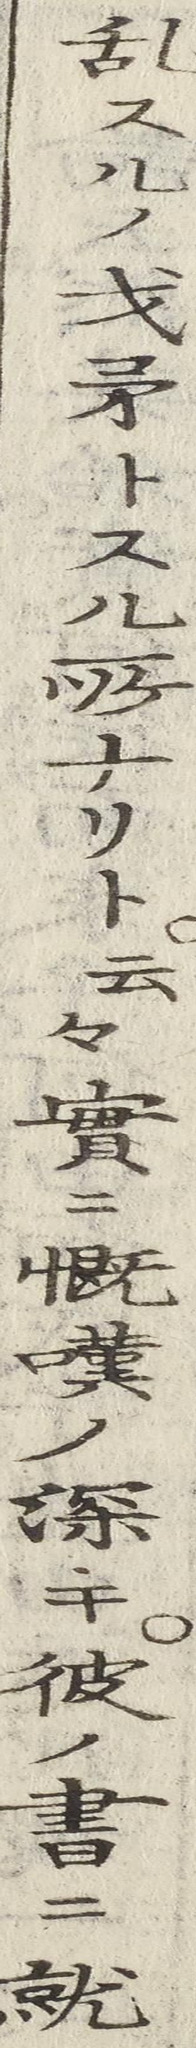乱スルノ戈矛トスル所ナリト。云々実ニ慨嘆ノ深キ。彼ノ書ニ就
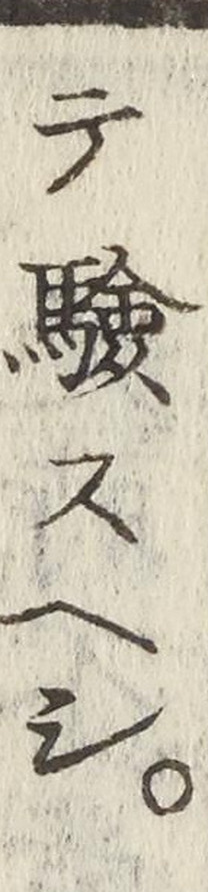テ験スヘシ。
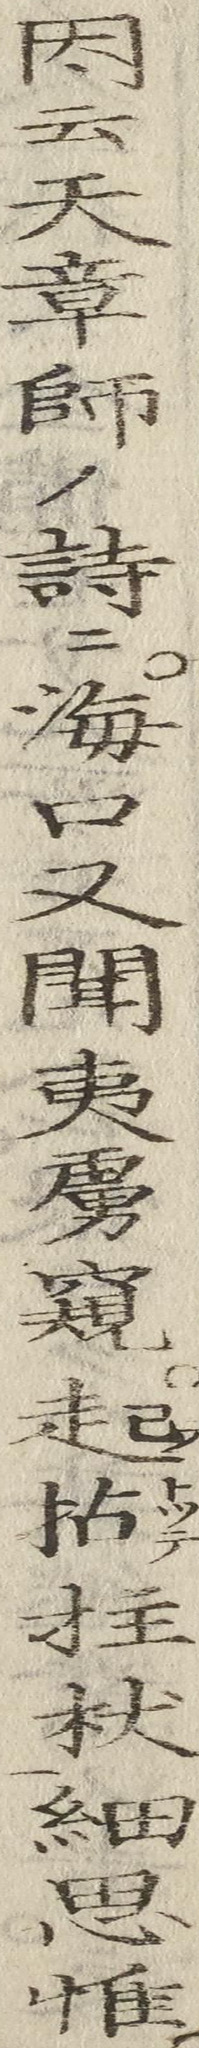因云天章師ノ詩ニ。海口又聞夷虜窺。起拈柱状細思惟。
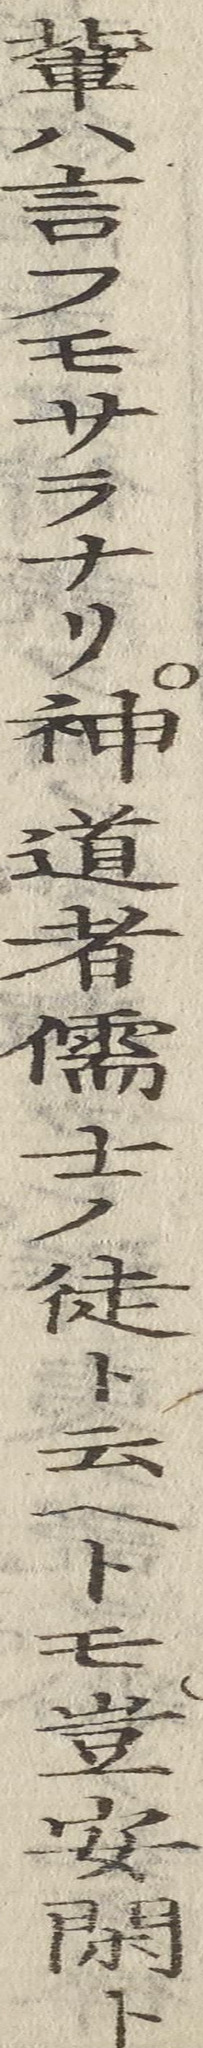輩ハ言フモサラナリ。神道者儒士ノ徒ト云ヘトモ。豈安閑ト
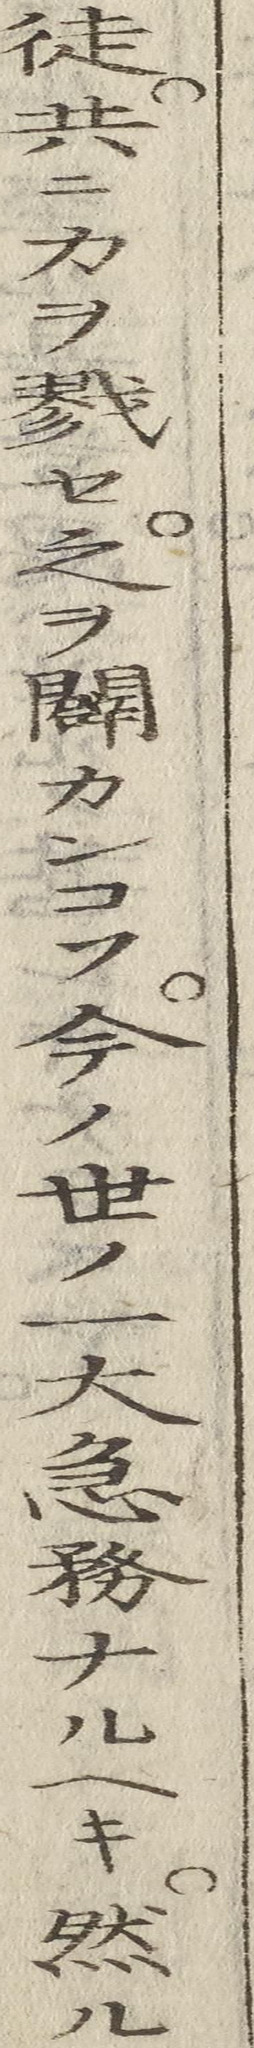徒。共ニ力ヲ戮セ。之ヲ闢カンコソ。今ノ世ノ一大急務ナルヘキ。然ル
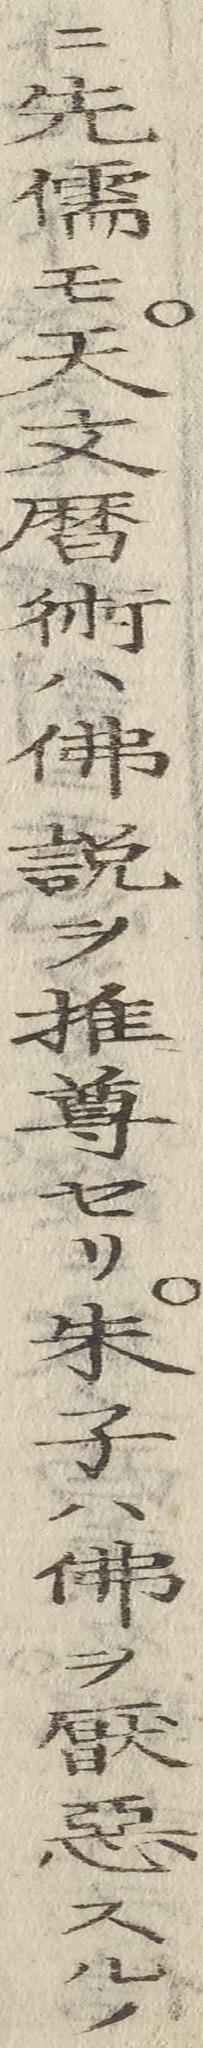ニ先儒モ。天文暦術ハ仏説ヲ推尊セリ。朱子ハ仏ヲ厭悪スルノ
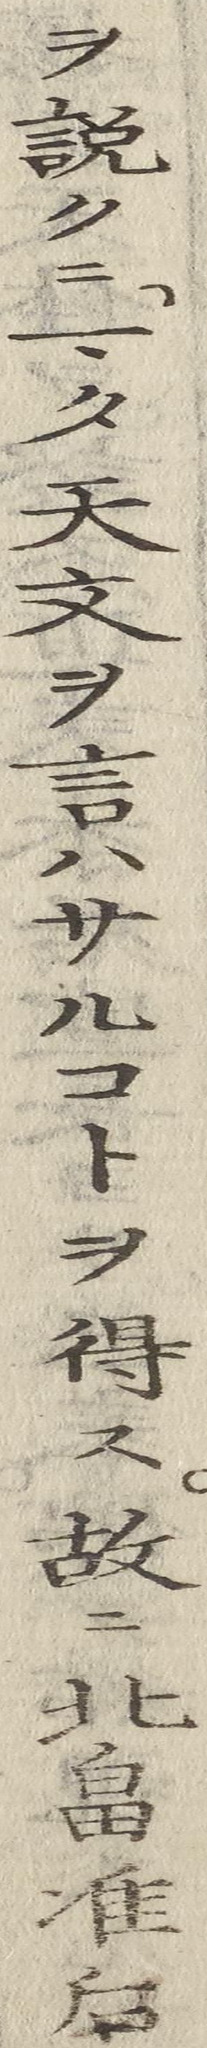ヲ説クニ。マタ天文ヲ言ハサルコトヲ得ス。故ニ北畠准后
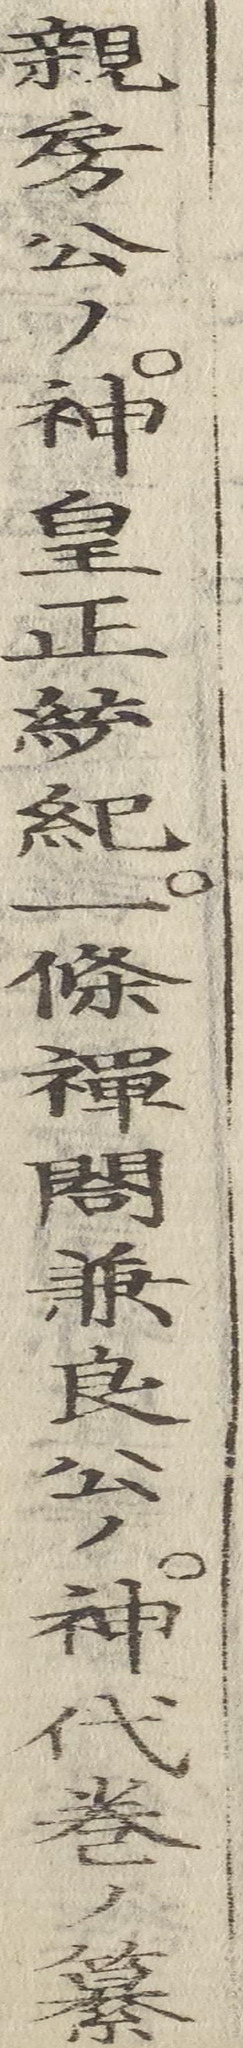親房公ノ。神皇正統紀。一条禅閤兼良公ノ。神代巻ノ簒

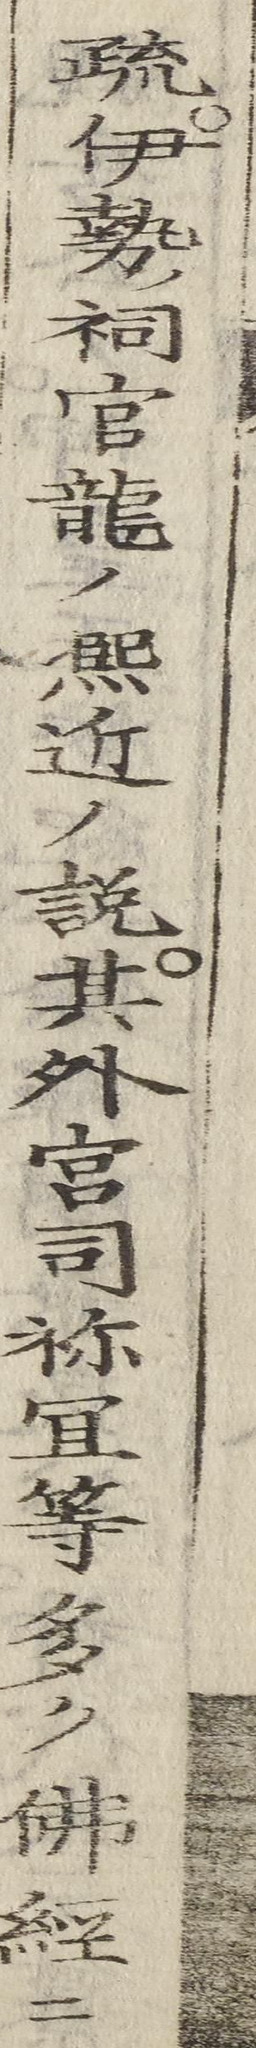疏。伊勢祠官龍ノ熙近ノ説。其外宮司禰宜等多ク仏経ニ
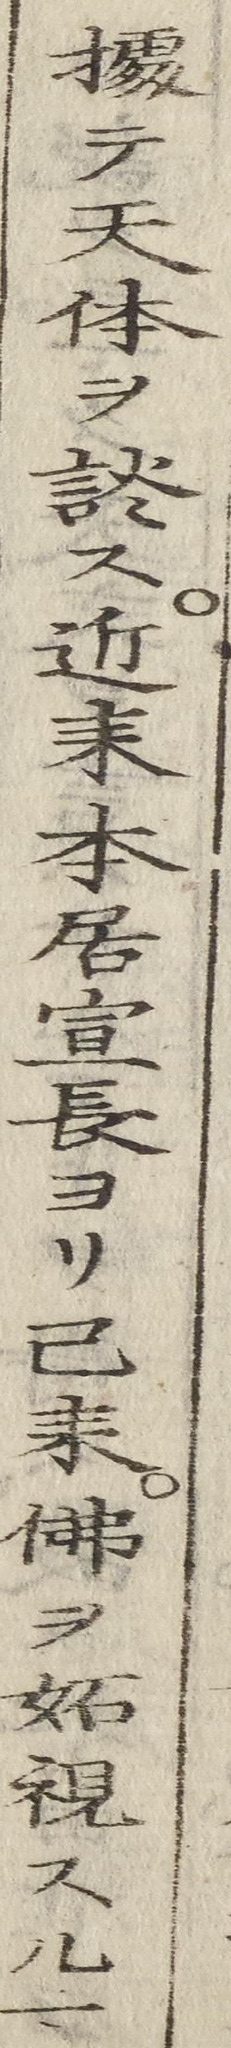拠テ天体ヲ談ス。近来本居宣長ヨリ己来。仏ヲ妬視スルマ
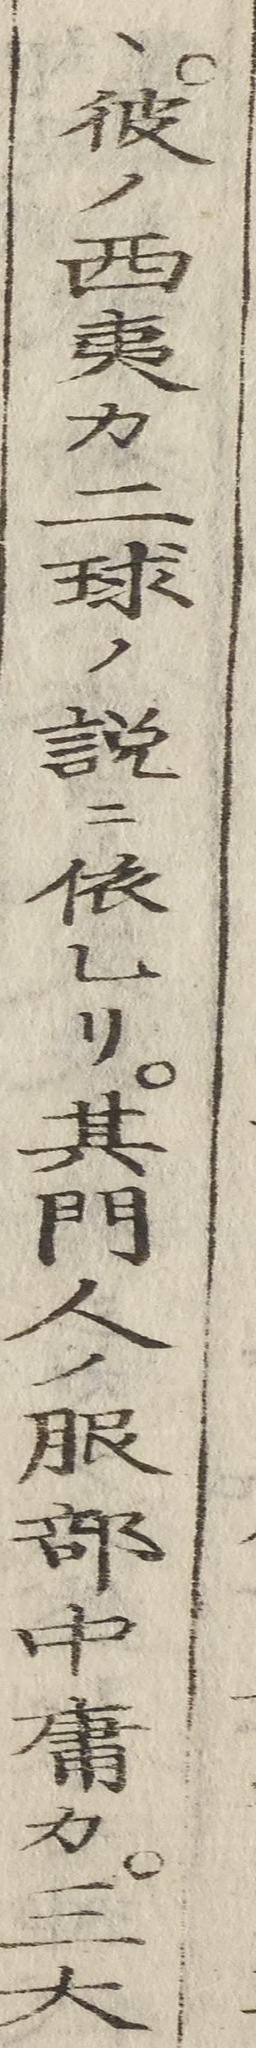ヽ。彼ノ西夷カ二球ノ説ニ依レリ。其門人ノ服部中庸カ。三大
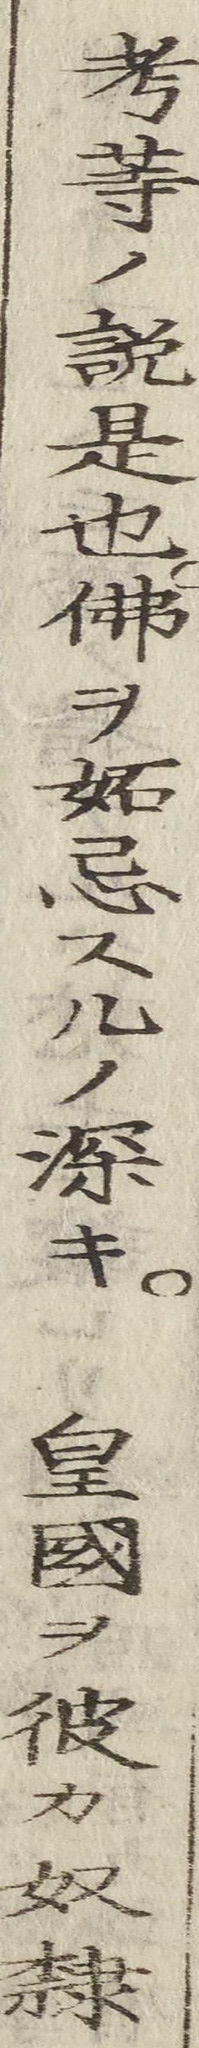考等ノ説是也。仏ヲ妬忌スルノ深キ。皇国ヲ彼カ奴隷
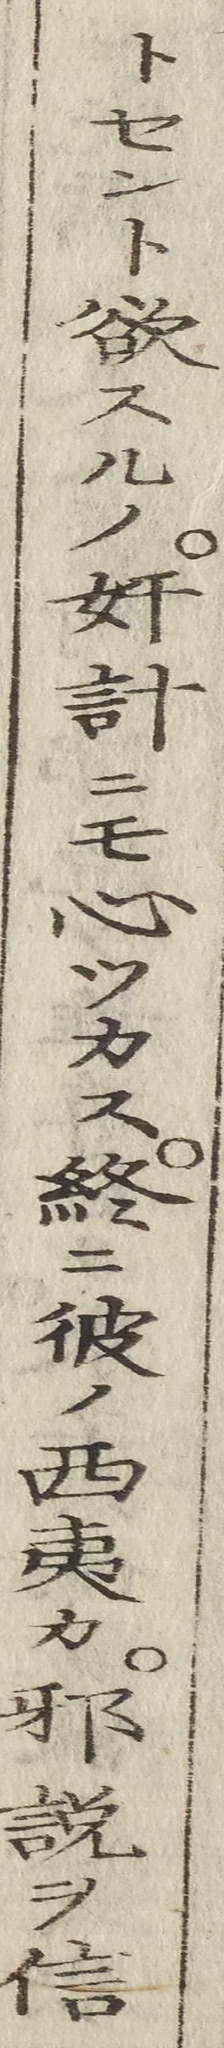トセント欲スルノ。奸計ニモ心ツカス。終ニ彼ノ西夷カ。邪説ヲ信
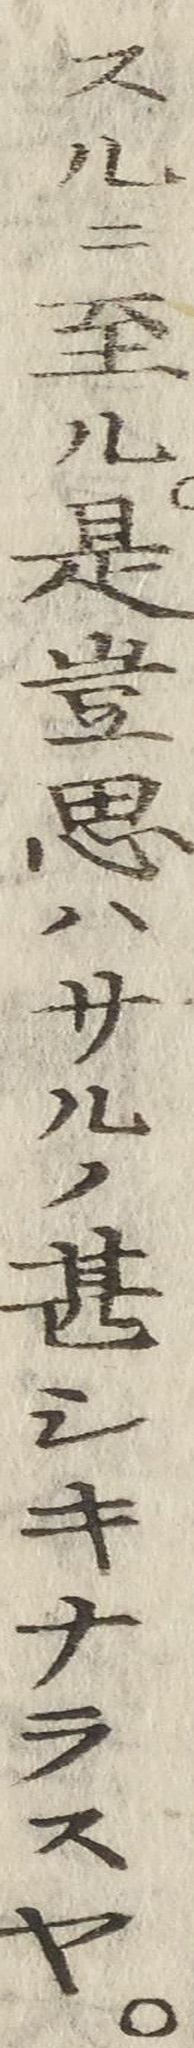スルニ至ル。是豈思ハサルノ甚シキナラスヤ。
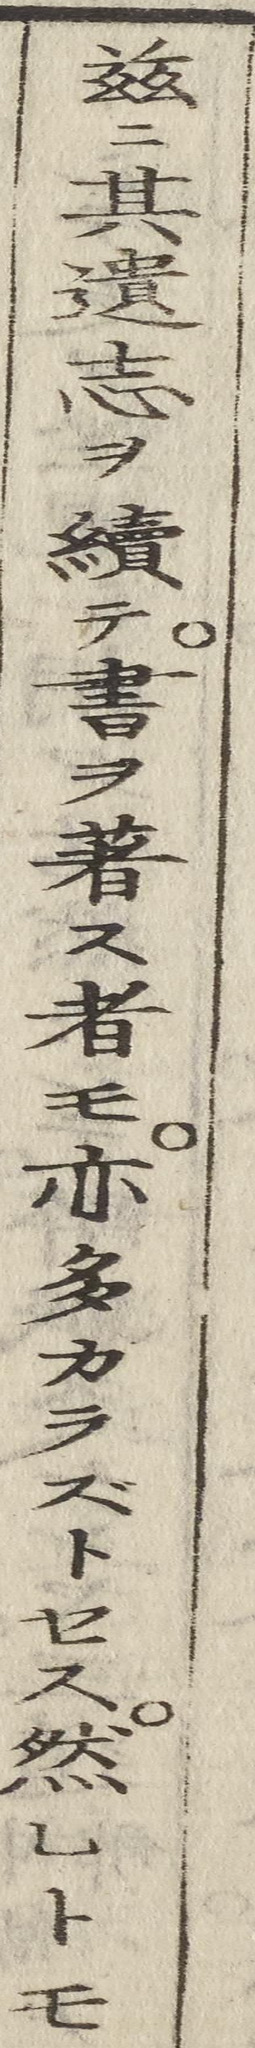茲ニ其遺志ヲ続テ。書ヲ著ス者モ。亦多カラストセス。然レトモ
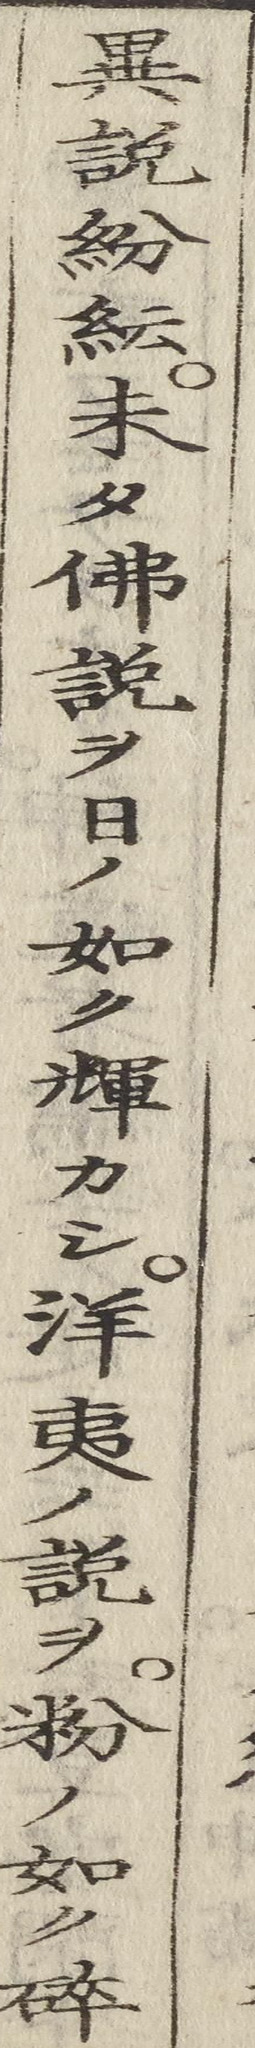異説紛紜。未タ仏説ヲ日ノ如ク輝カシ。洋夷ノ説ヲ。粉ノ如ク砕
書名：護法新論　上
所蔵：東京大学地震研究所図書室 Earthquake Research Institute Library, The University of Tokyo, JAPAN
